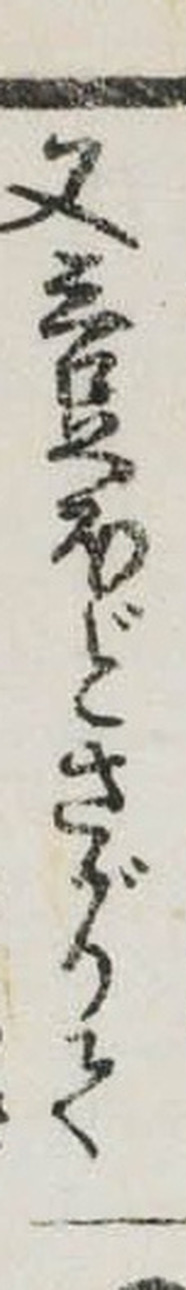又三足ほどさがりて
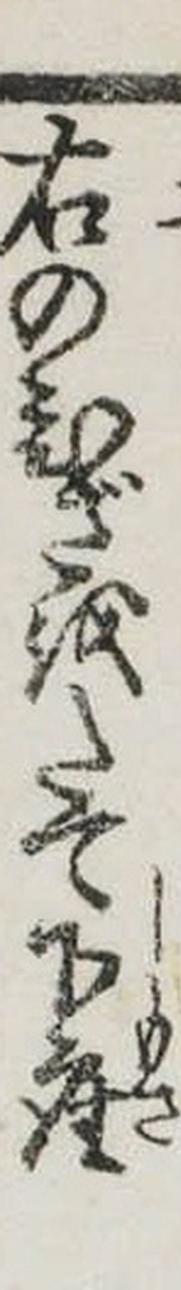右のひざをたて下座
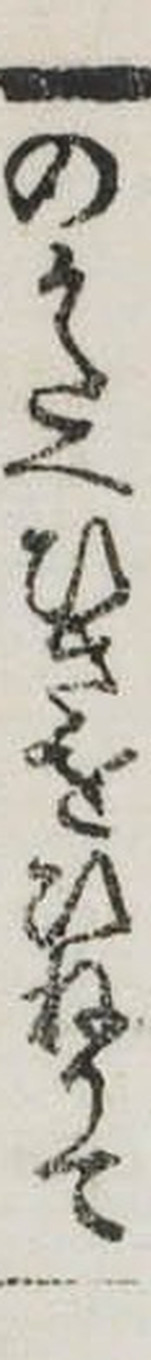のかたへひさをひねりて
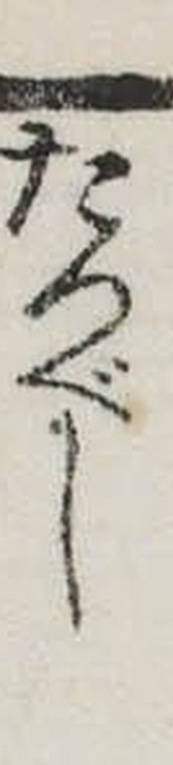たつべし
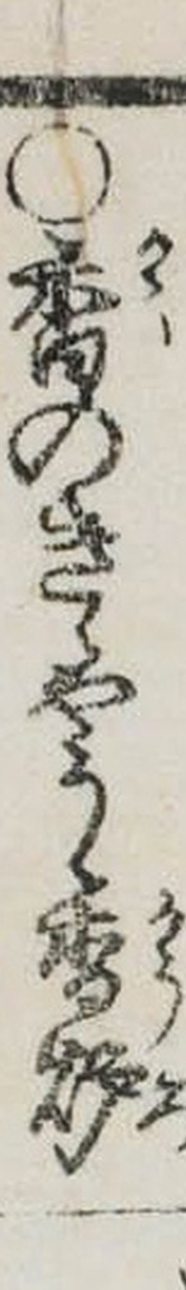○香のきゝやう香炉
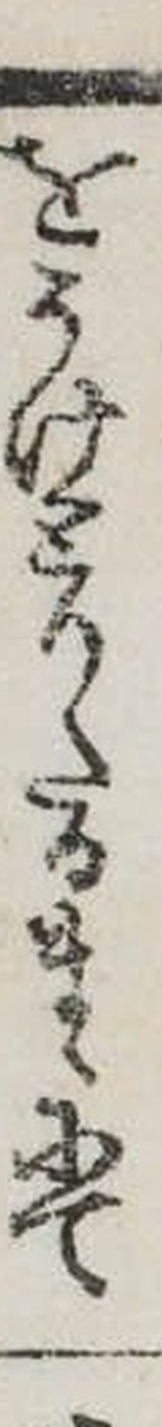をうけとりたるまゝにて
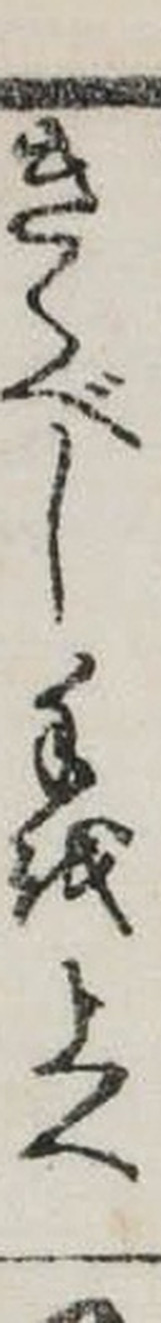きくべし手を上へ
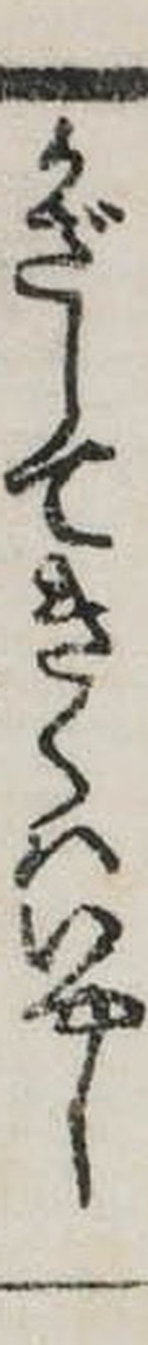かざしてきくはいやし
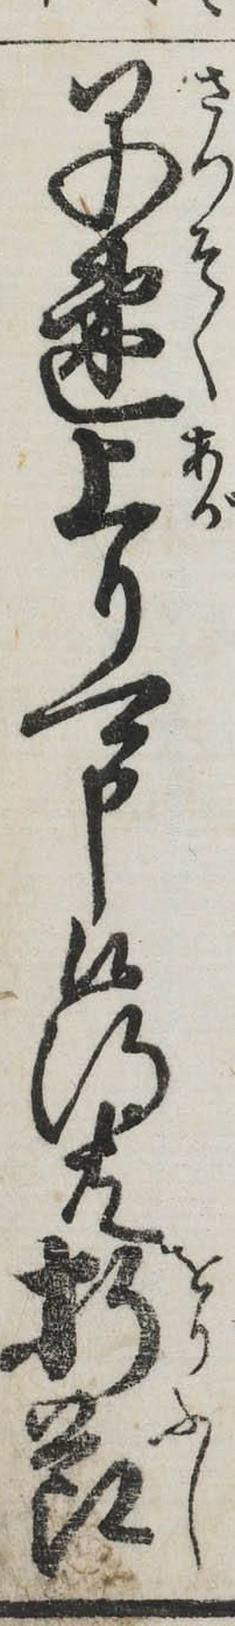早速上り可申候得共折節
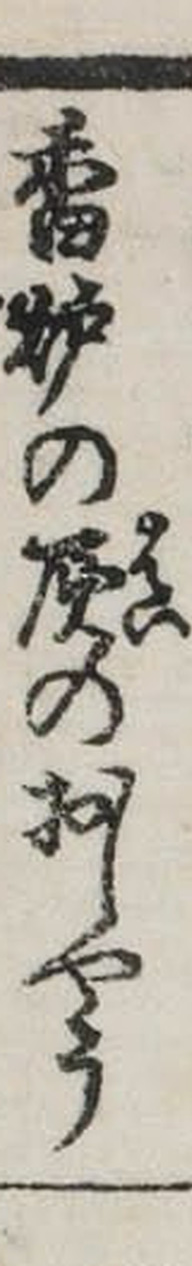香炉の灰のおしやう
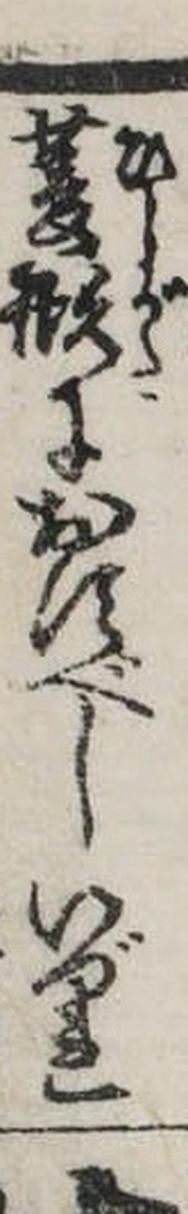菱形におすべしいづれ
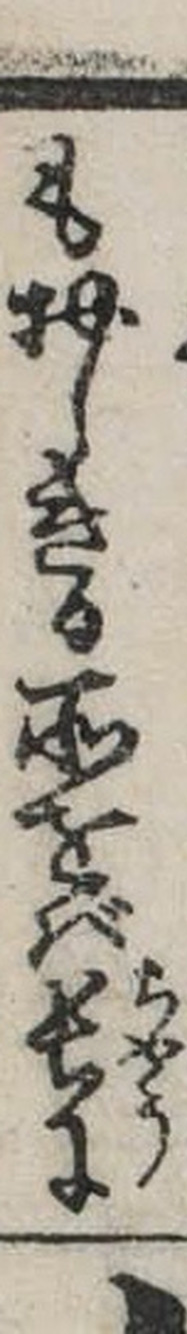もおしきる所をば長に
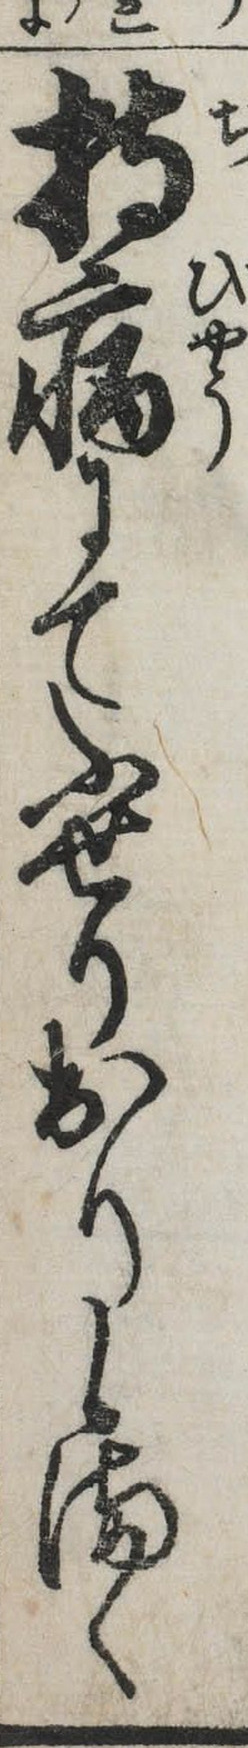持病にてふせりおり候まゝ

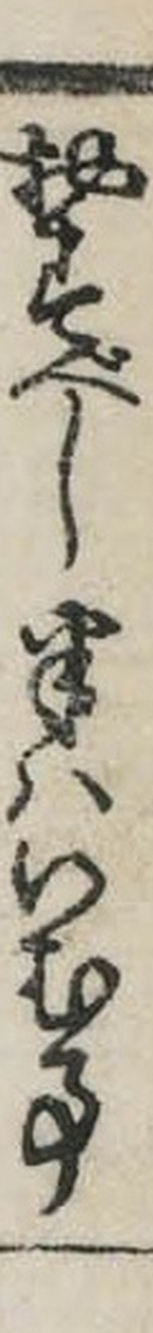おすべし半はいむ事
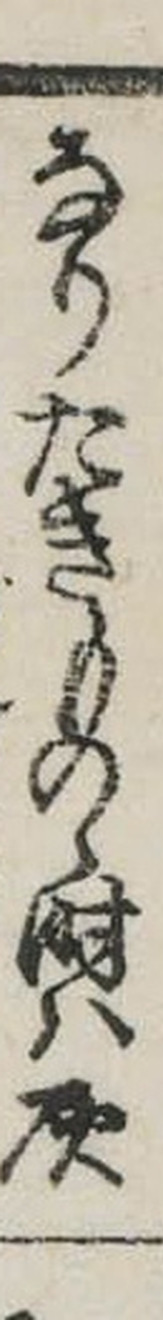なりたきものゝ時は灰
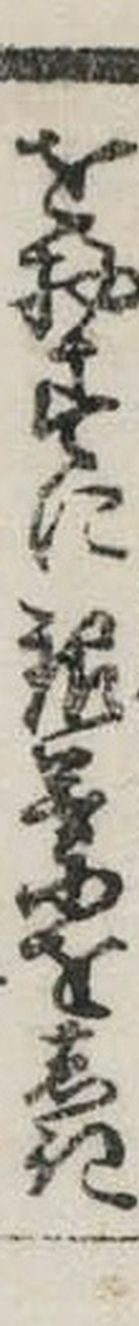をおすに銀葉をしき
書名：頭書萬用婦人手紙之文言
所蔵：東京学芸大学教育コンテンツアーカイブ
